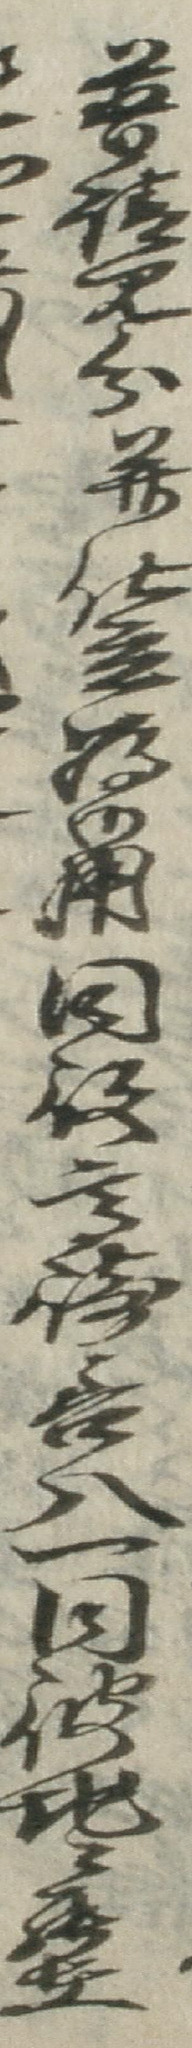普請見分幷仕立為御用同役高崎善八一同彼地二罷在
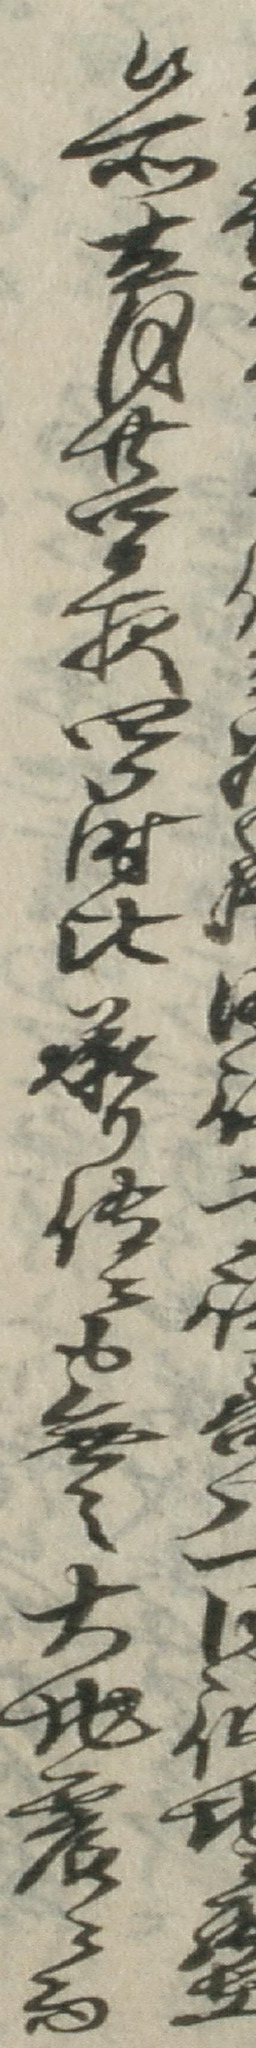候所去月廿四日夜四ッ時比承り伝二も無之大地震二而
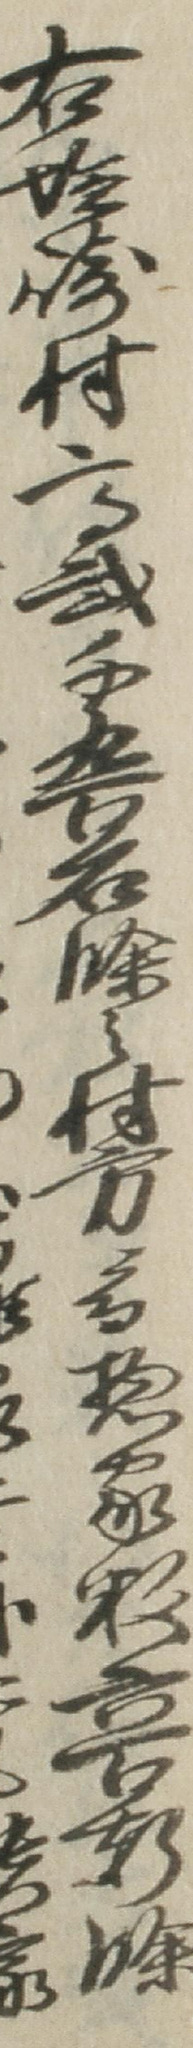右塩崎村高弐千九百石余之村方二而惣家数六百軒余
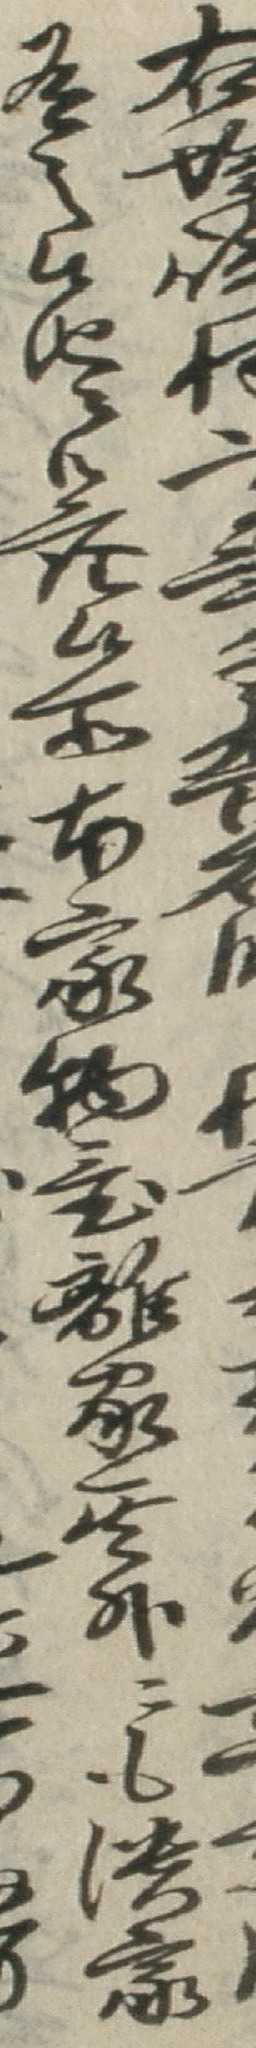有之候由二御座候所本家物置離家其外二も潰家
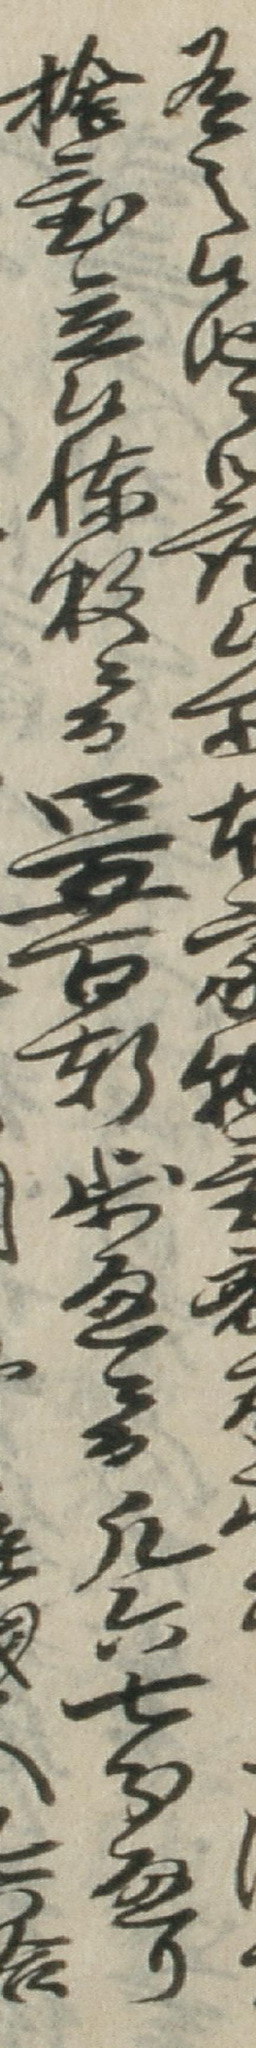捨置立候棟二而四五百軒歩通二而凡六七分通り
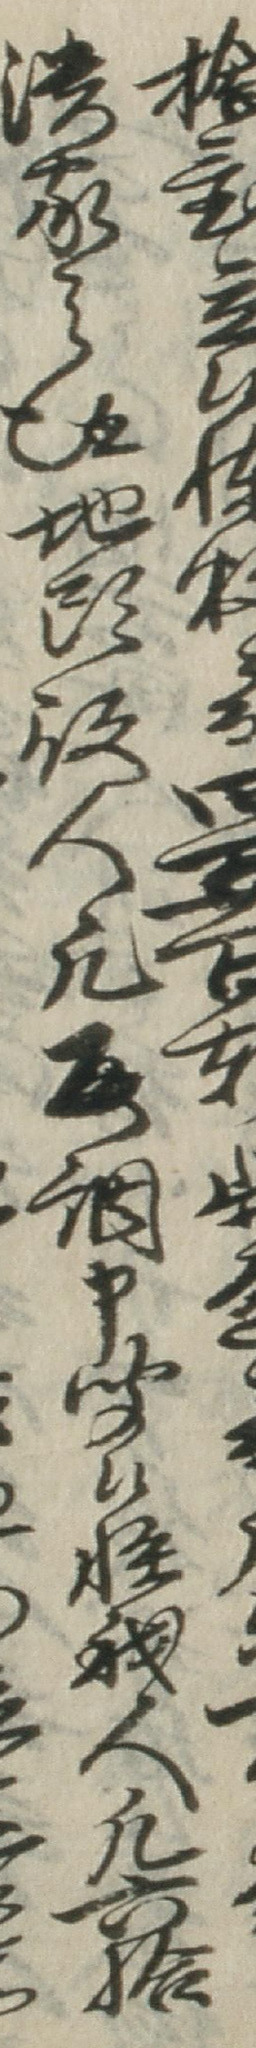潰家之趣地頭役人凡取調申聞候怪我人凡六拾
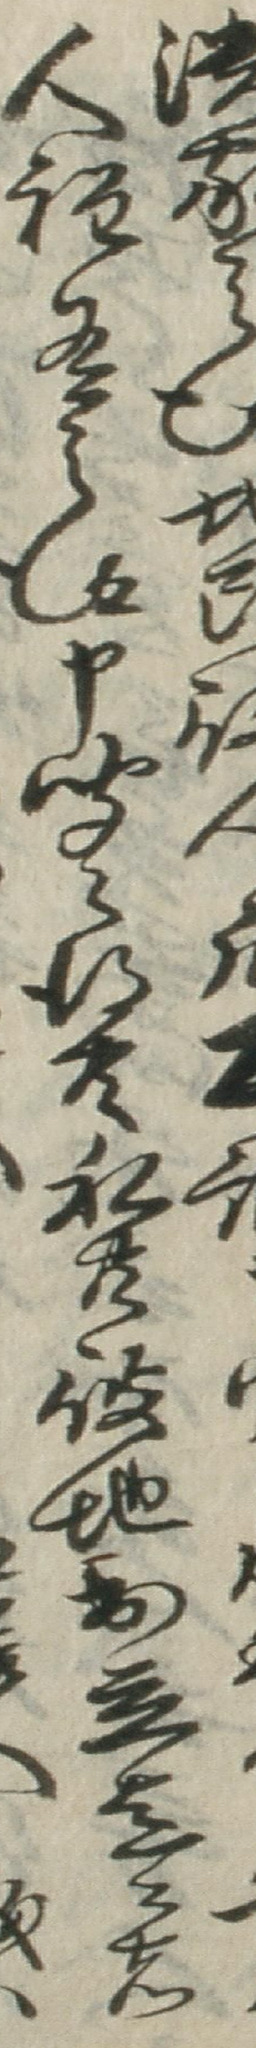人程有之趣申聞候得共私共彼地出立迄二は
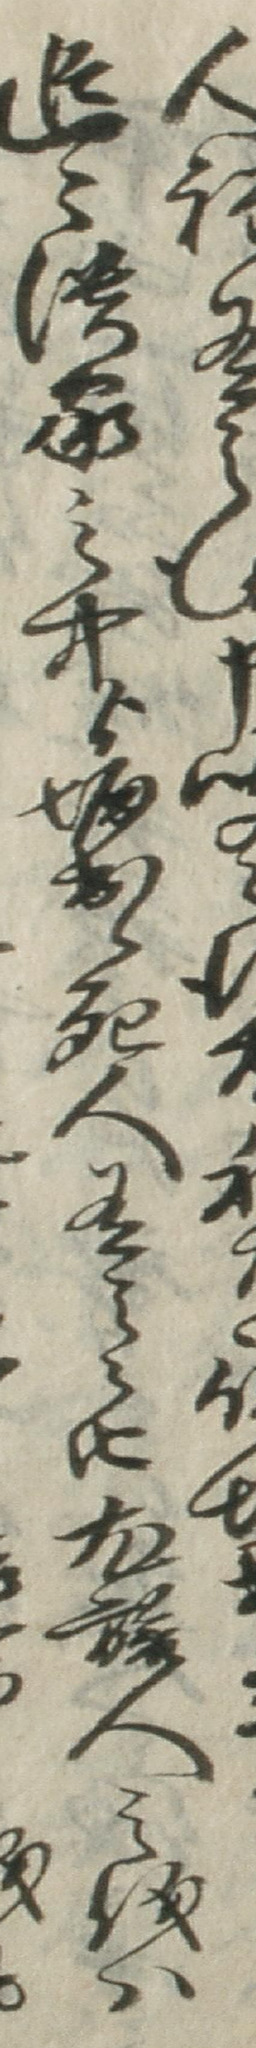追々潰家之中ゟ掘出候死人有之候由尤旅人之儀ハ
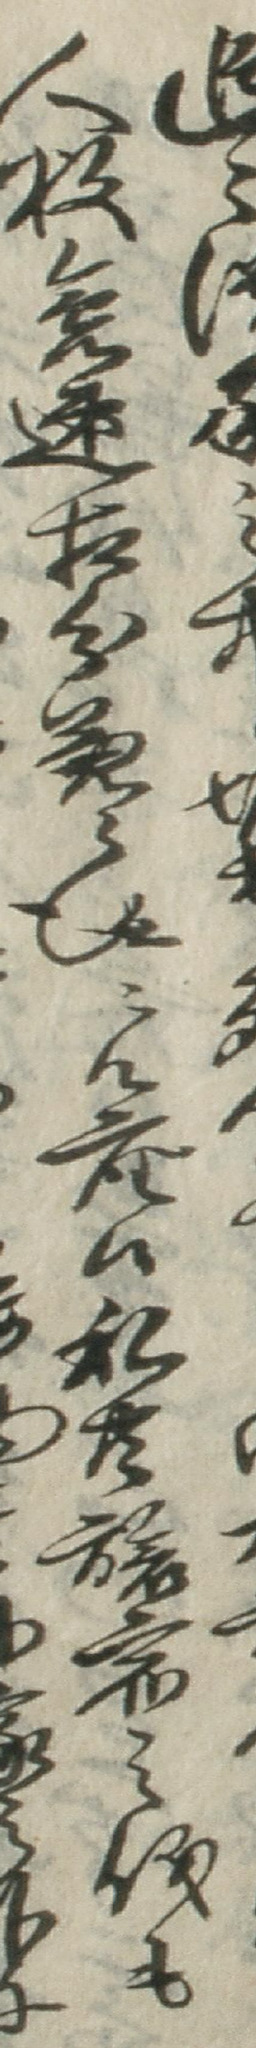人数急速相分兼候趣二御座候私共旅宿之儀も
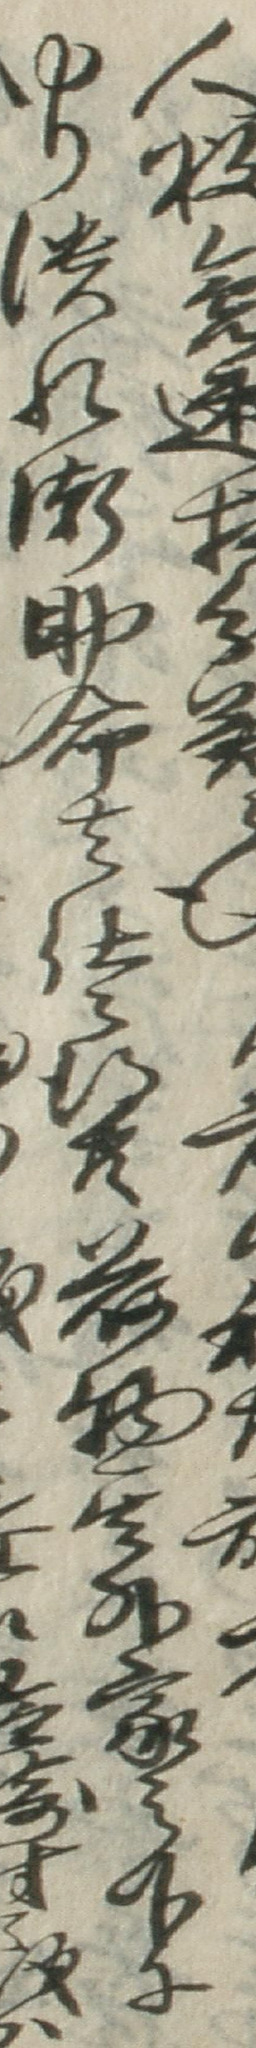ゆり潰れ漸助命は仕候得共荷物其外家之下に
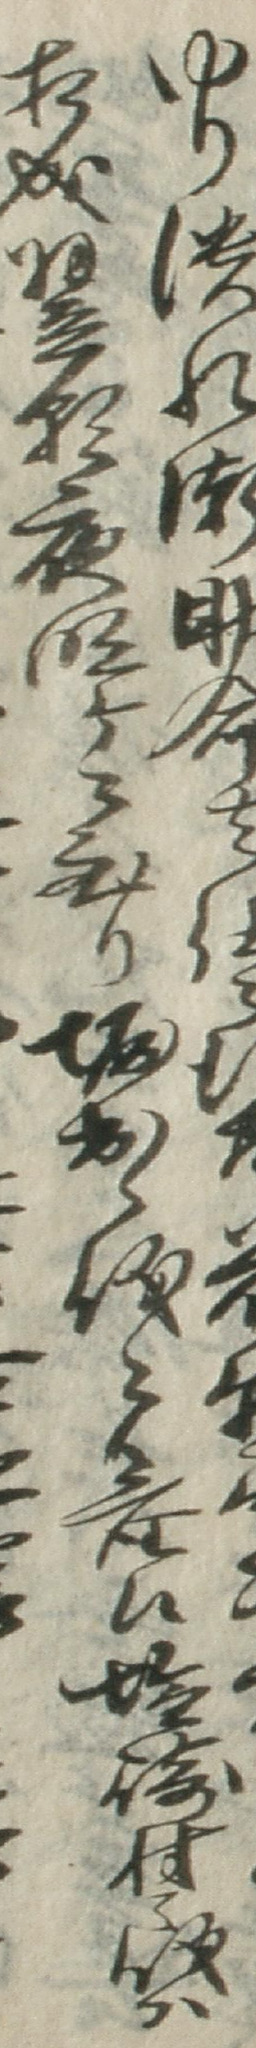相成翌朝夜明ヶ二至り掘出候儀二御座候塩崎村之儀ハ
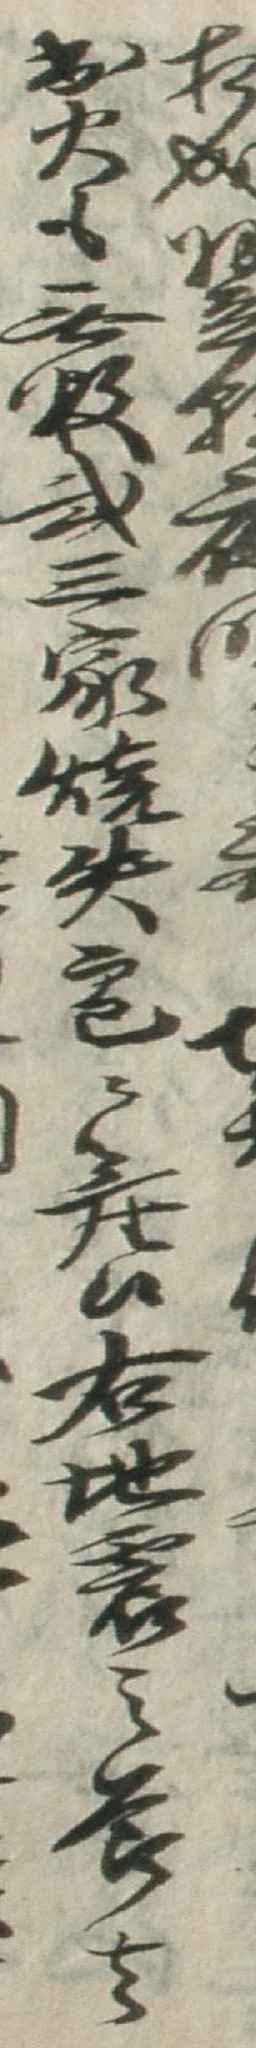出火も無数弐三家焼失而已二御座候右地震之節者は
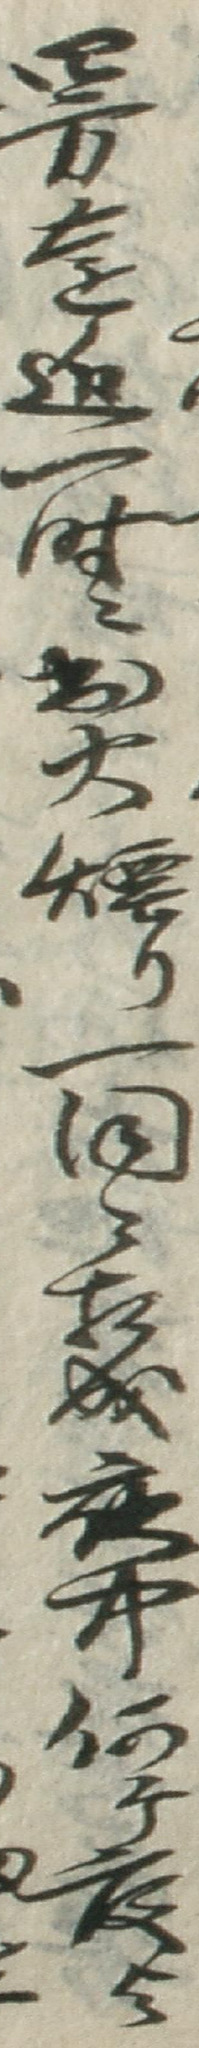四方遠近一時二出火煙り一同二相成夜中何ヶ度と
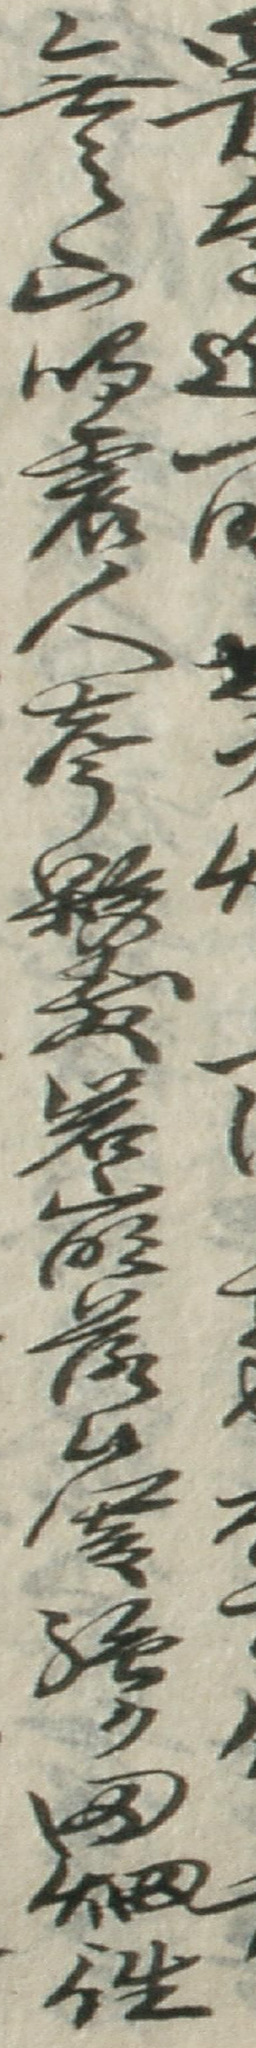無之山鳴震人声夥敷岩崩落候響強ク田畑往
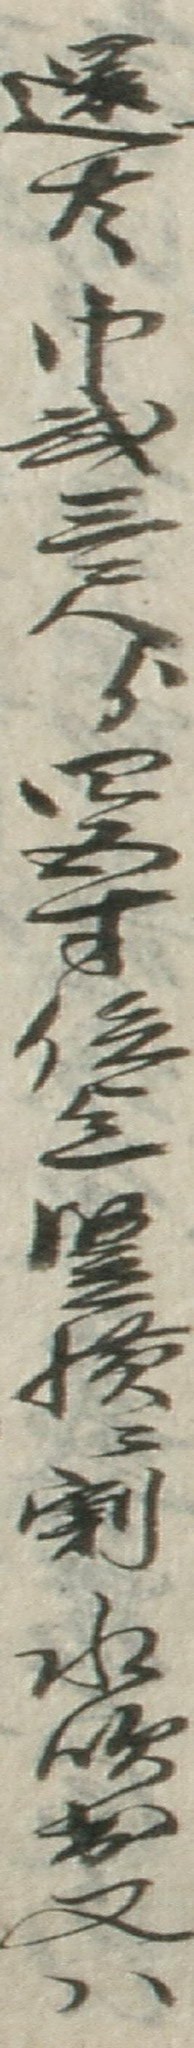還共巾弐三尺ゟ四五寸位迄竪横二割水吹出又ハ
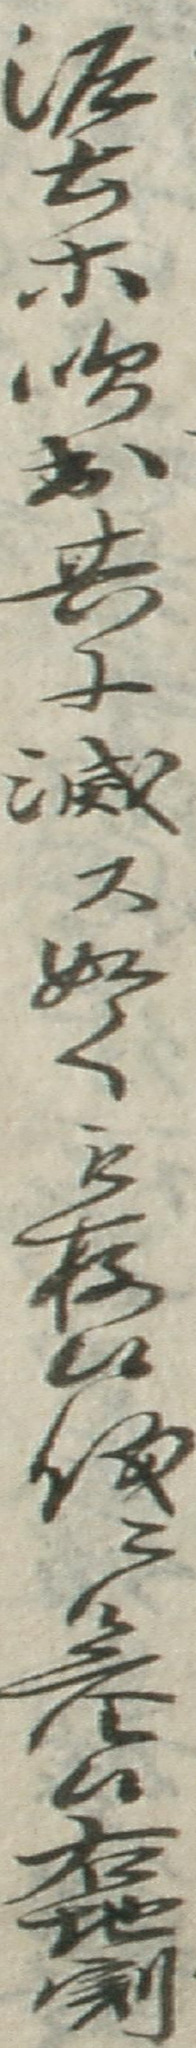泥土等吹出共に滅ス如く被存候儀二御座候右地割
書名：信濃國地震實録記
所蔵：東京大学地震研究所図書室 Earthquake Research Institute Library, The University of Tokyo, JAPAN
